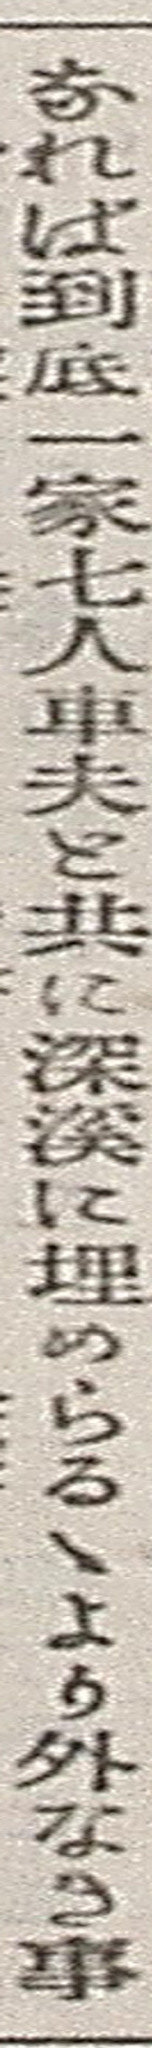なれば到底一家七人車夫と共に深渓に埋めらるゝより外なき事
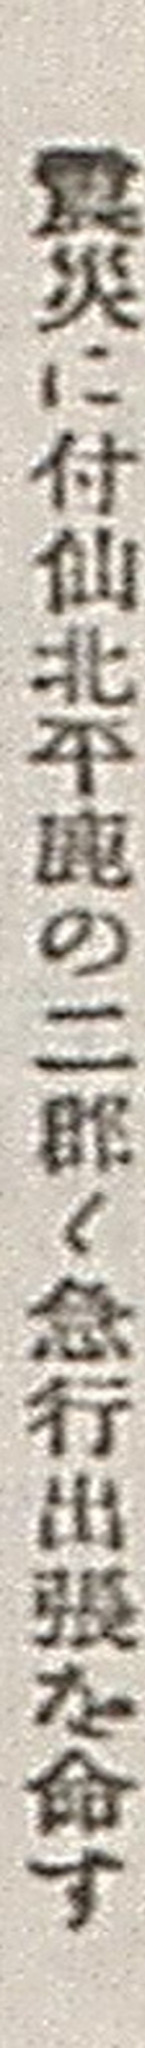震災に付仙北平鹿のニ郡の急行出張を命す
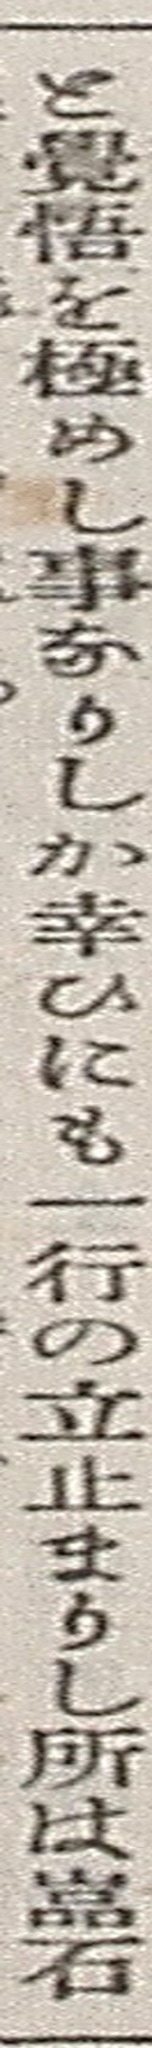と覚悟を極めし事なりしか幸ひにも一行の立止まりし所は嵓石
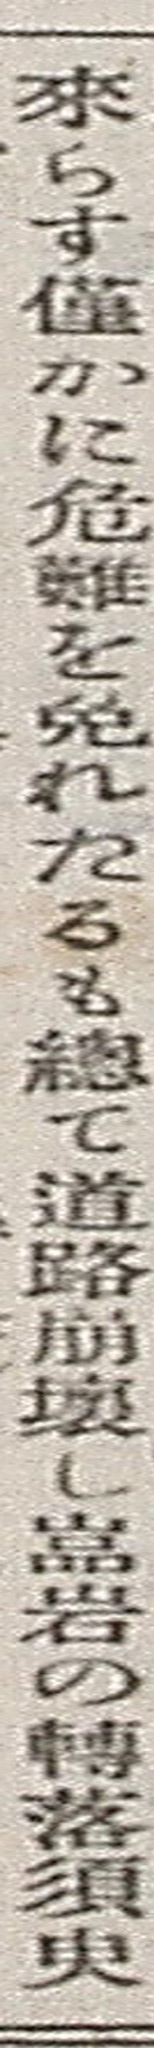来らす僅かに危難を免れたるも総て道路崩壊し嵓石の転落須臾
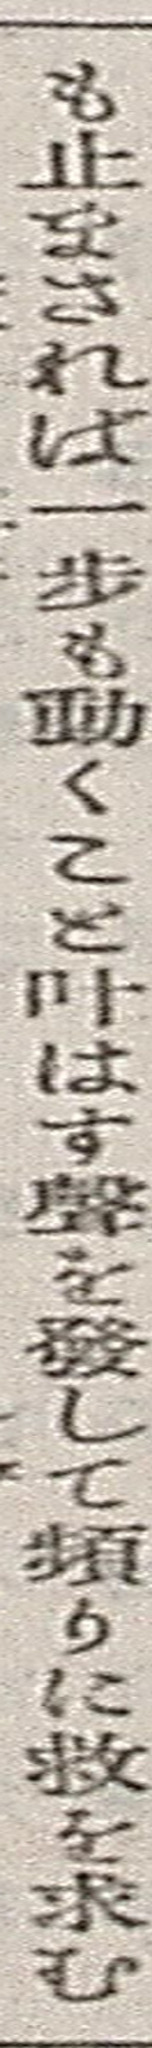も止まされば一歩も動くこと叶はす声を発して頻りに救を求む
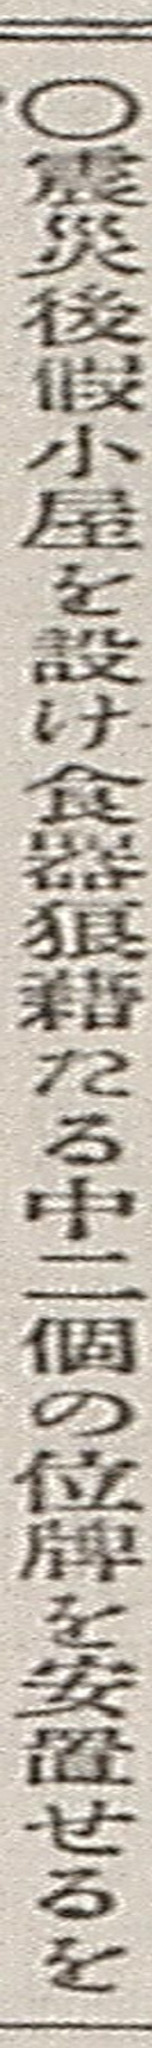〇震災後仮小屋を設け食器狼藉たる中二個の位牌を安置せるを
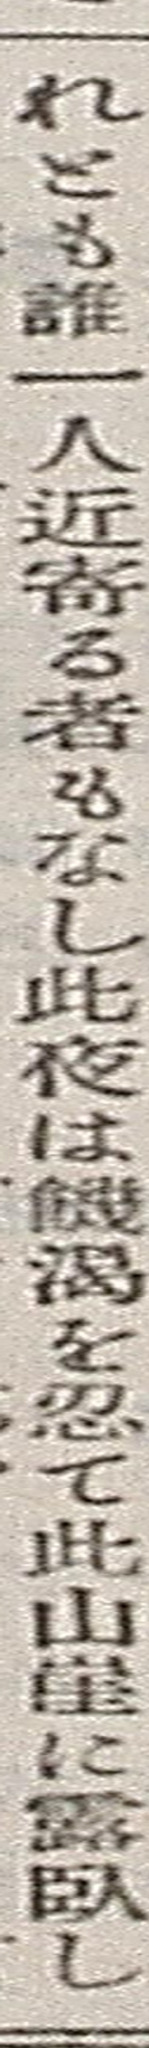れとも誰一人近寄る者もなし此夜は餓渇を忍て此山崖に露臥し
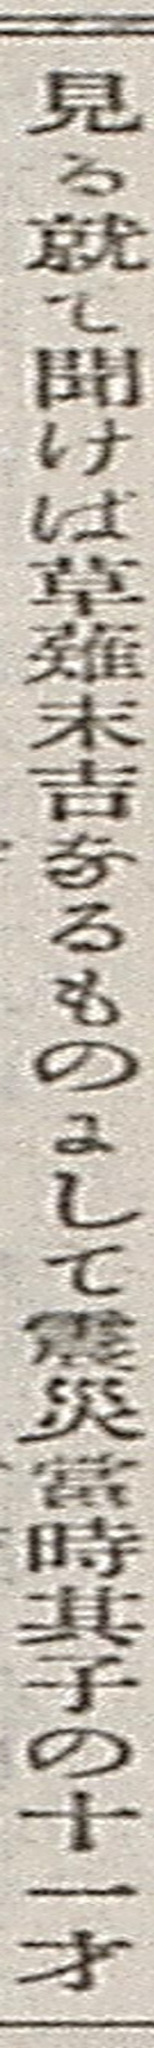見る就て聞けは草薙末吉なるものにして震災当時其子の十一才
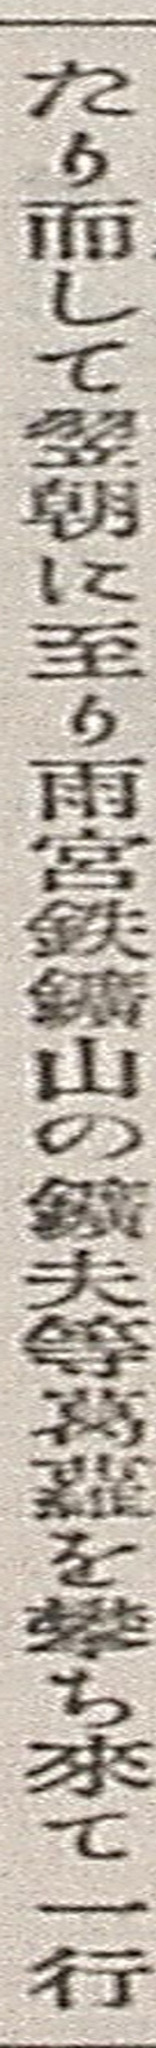たり而して翌朝に至り雨宮鉄鉱山の鉱夫等葛蘿を攀ち来て一行
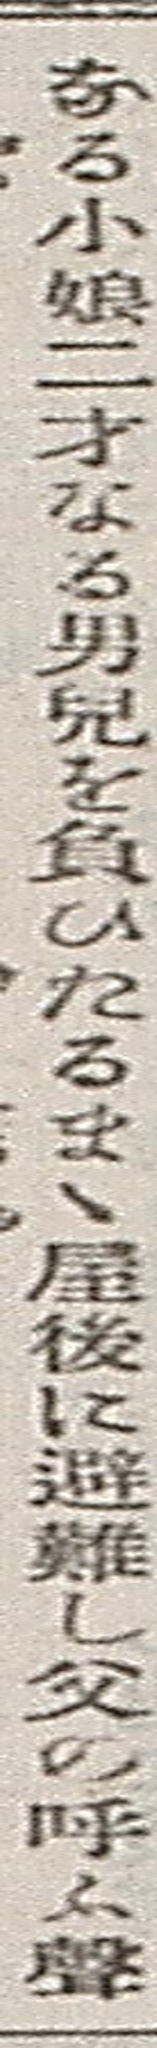なる小娘二才なる男児を負ひたるまゝ屋後に避難し父の呼ふ声
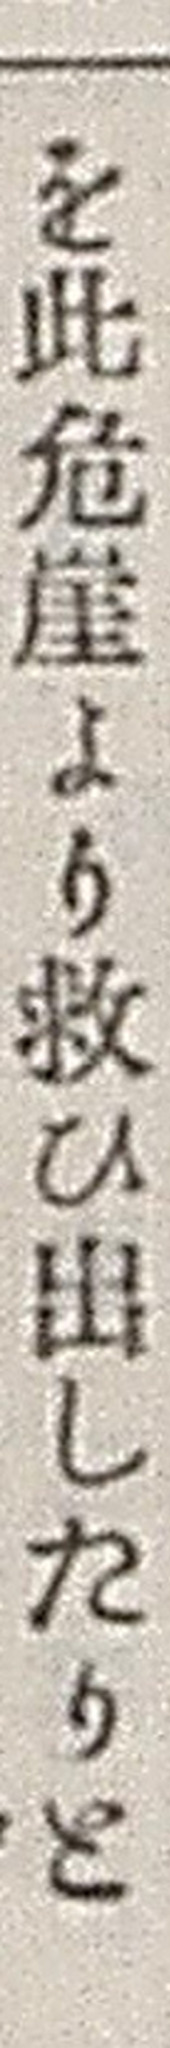を此危崖より救ひ出したりと
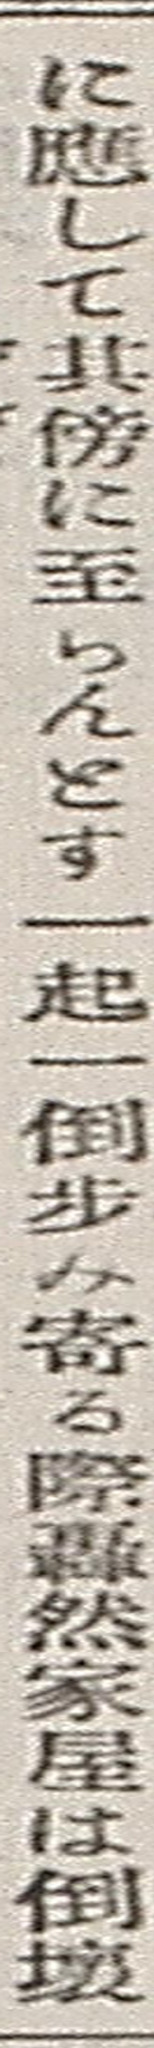に応して其傍に至らんとす一起一倒歩み寄る際轟然家屋は倒壊
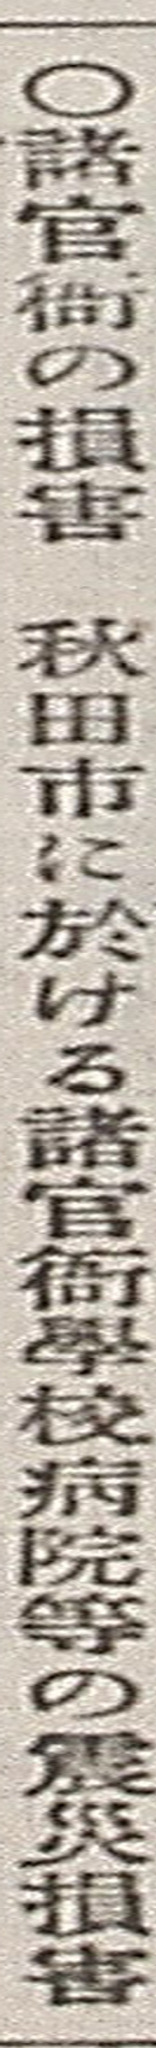〇諸官衙の損害秋田市に於ける諸官衙学校病院等の震災損害
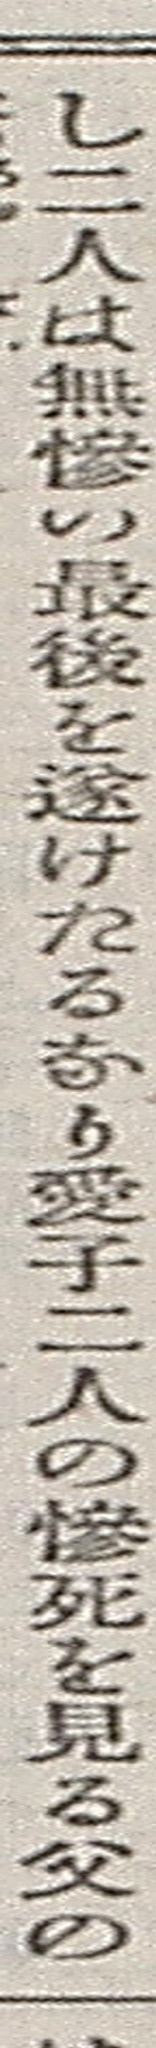し二人は無惨の最後を遂けたるなり愛子二人の惨死を見る父の
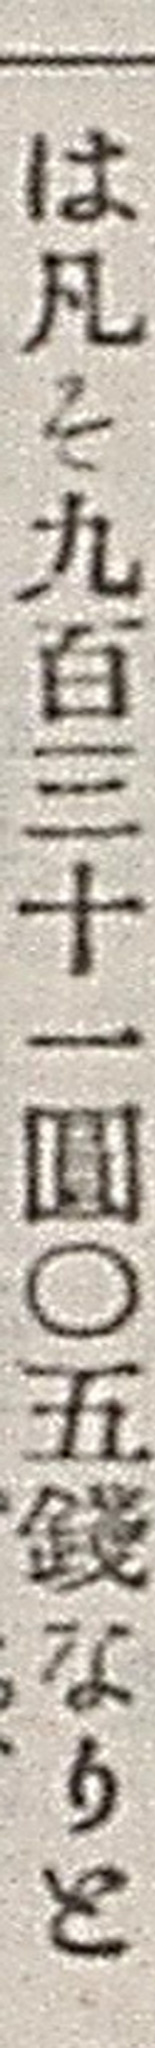は凡そ九百三十一円〇五銭なりと
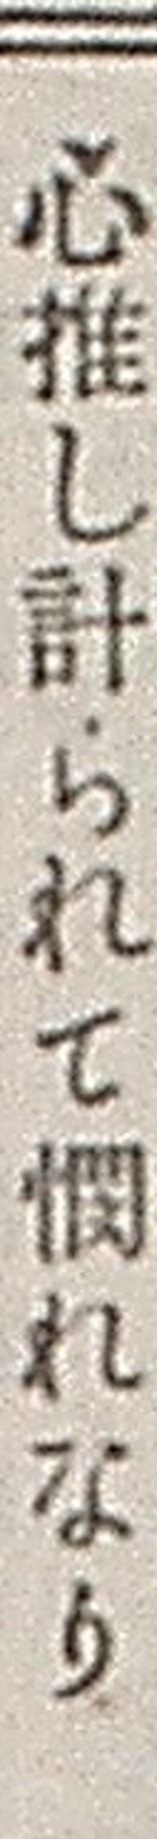心推し計られて憫れなり
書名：風俗畫報臨時増刊第百二十四號　洪水地震被害録（上）
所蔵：東京大学地震研究所図書室 Earthquake Research Institute Library, The University of Tokyo, JAPAN
